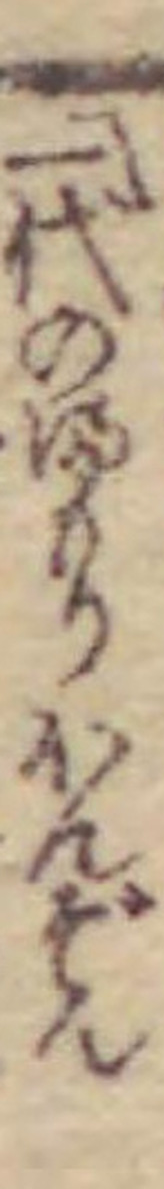〽一代のまもりほんぞん
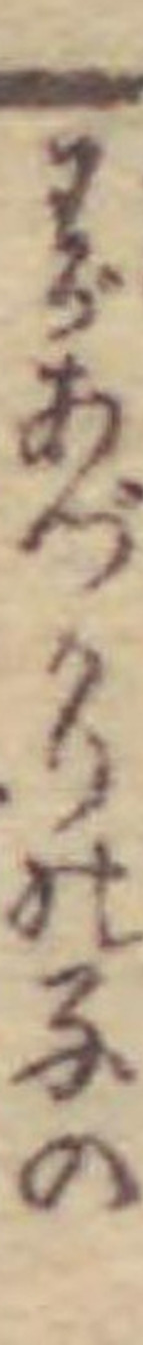わがあづかりの子の
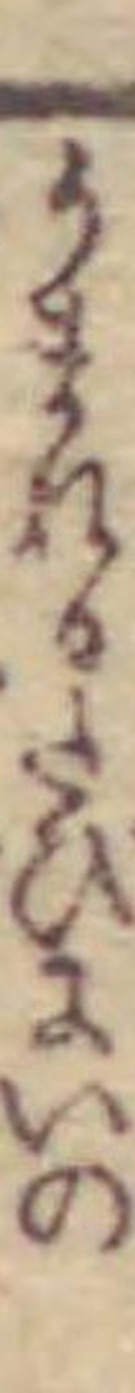うまれるたびにいの
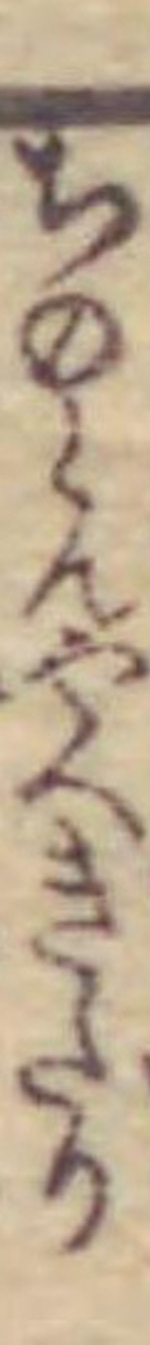ちのとんやへきたり
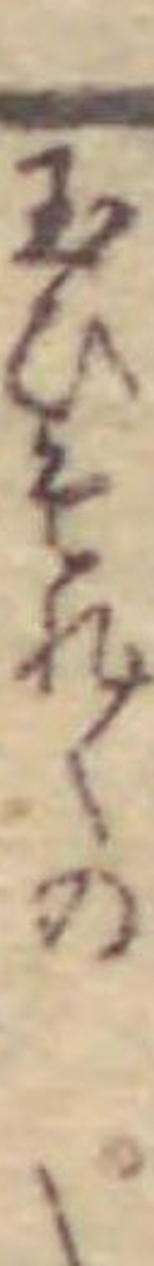玉ひそれ〳〵の
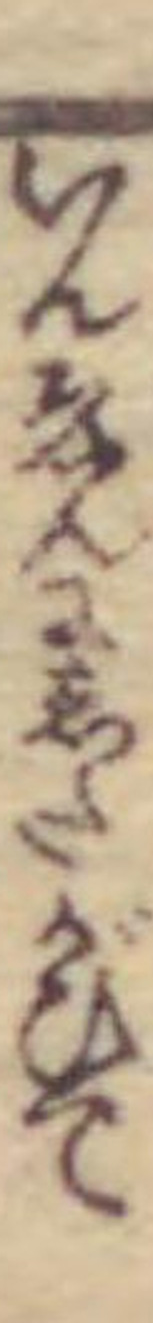いんゑんにしたがひて
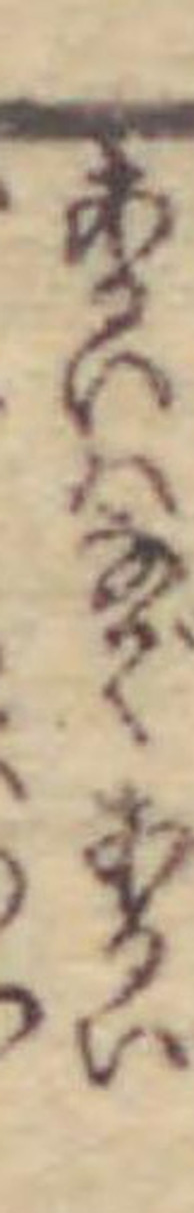あるいはながくあるい
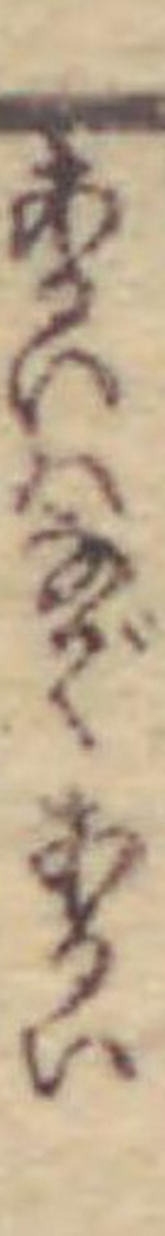あるいはながくあるい
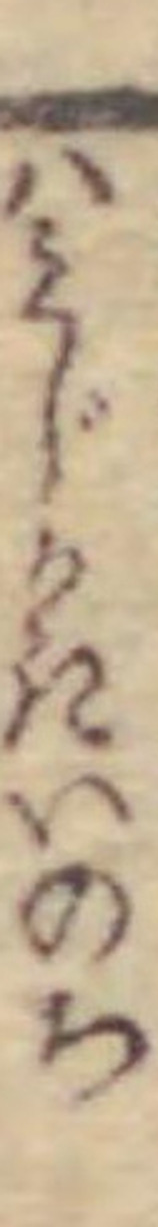はみじかきいのち
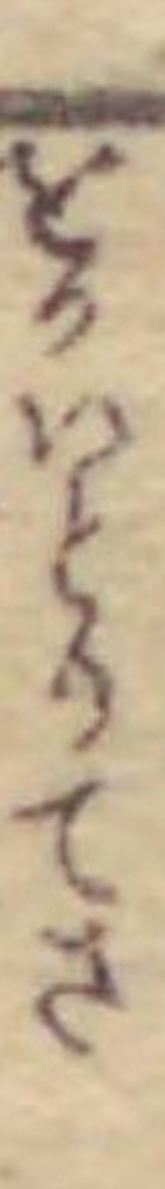をかいとりてさ
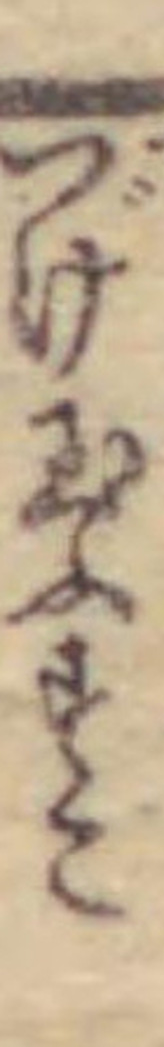づけ玉ふすこ
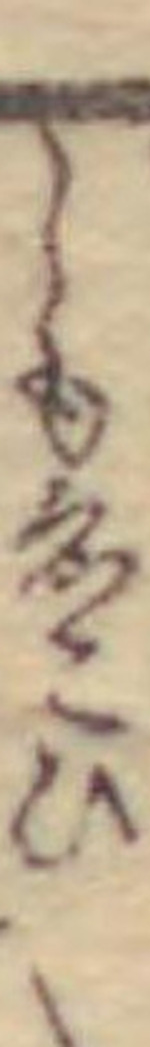しもゑこひ
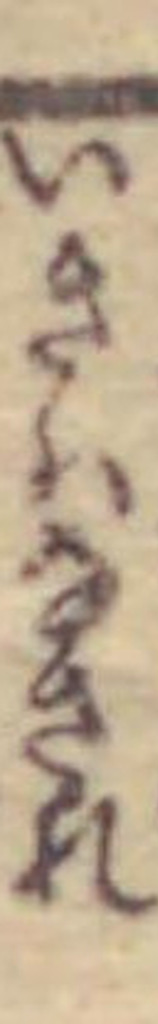いきはなされ
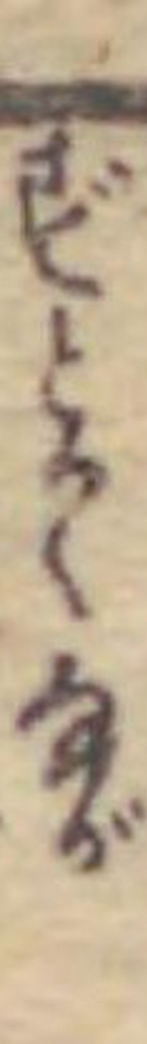ずとかくなが
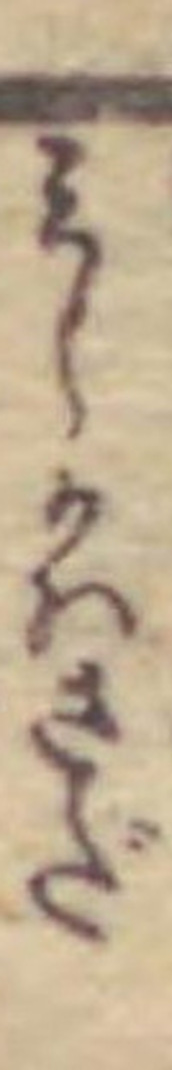みしかはさだ
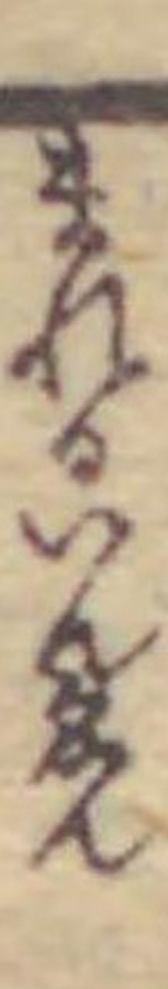まれるいんゑん
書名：御誂染長寿小紋 : 3巻
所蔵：国立国会図書館 National Diet Library, JAPAN
